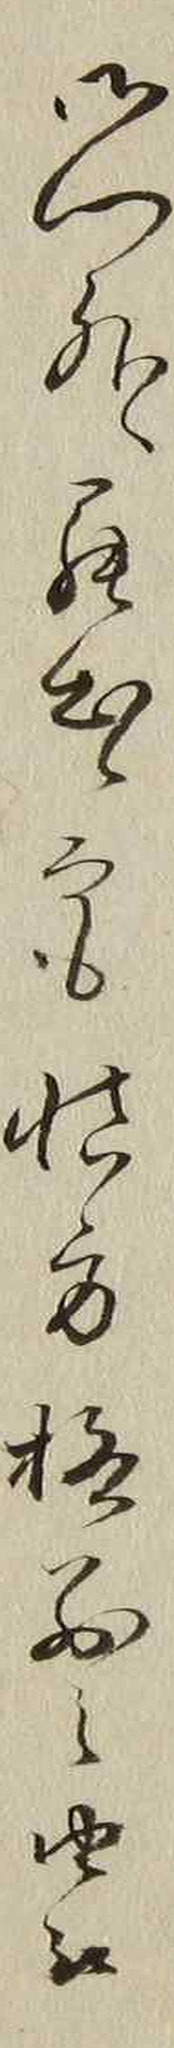御門外へ罷出候而も慎方格別之由被
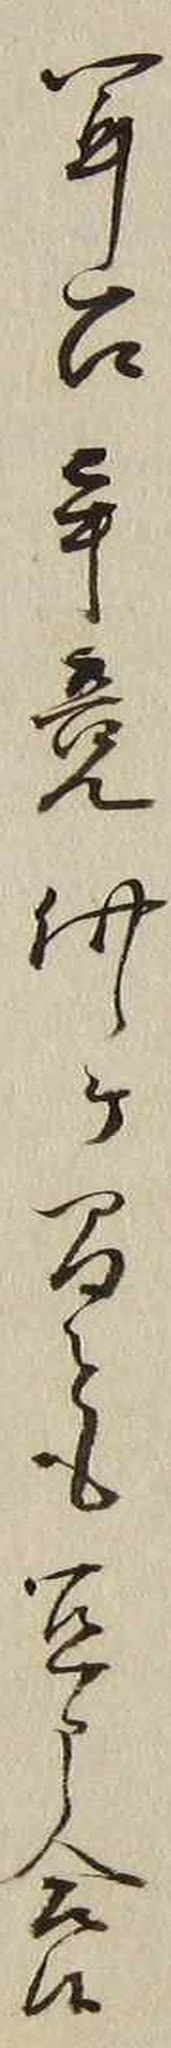聞召畢竟仲ケ間とも宜申合候
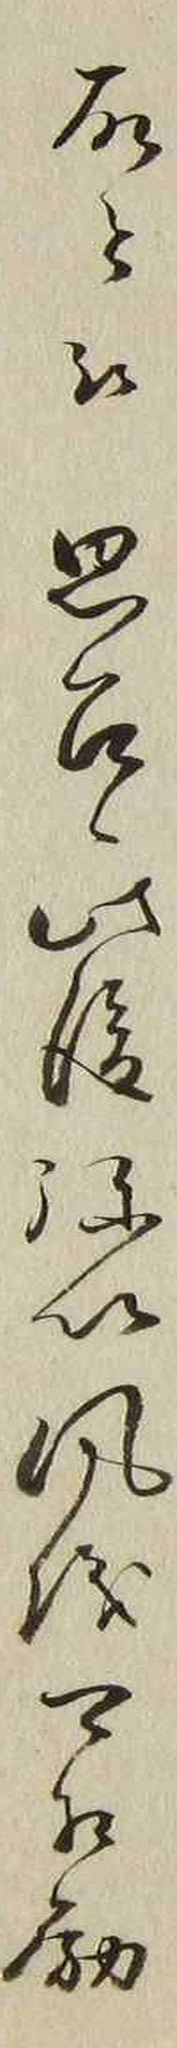故と被思召候此後弥以風儀可相励
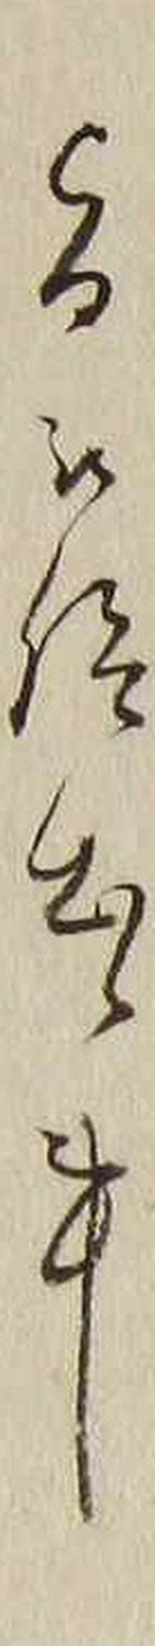旨被仰出候事
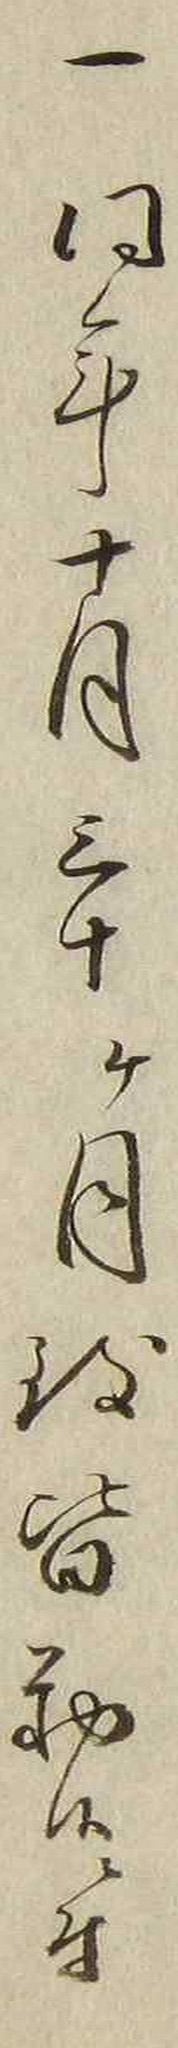一同年十月三十ケ月致皆勤候ニ付

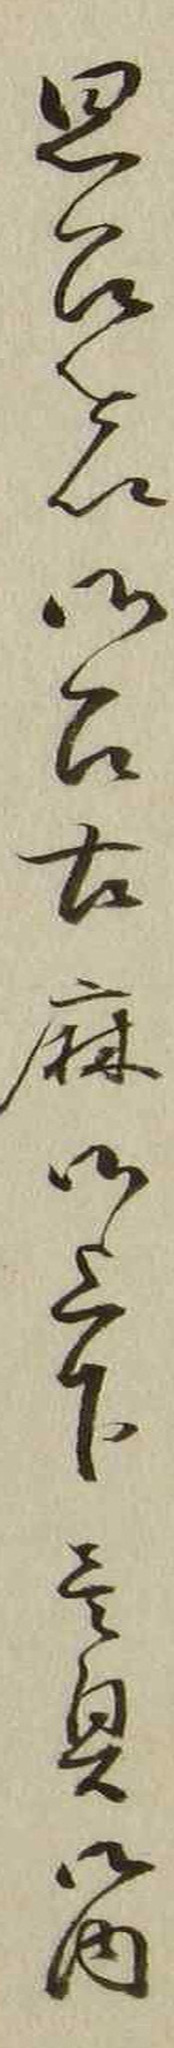思召を以御召古麻御上下壱具御内
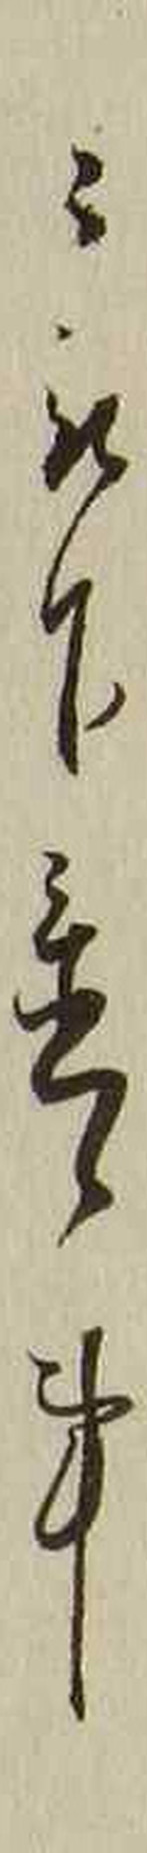々被下置候事
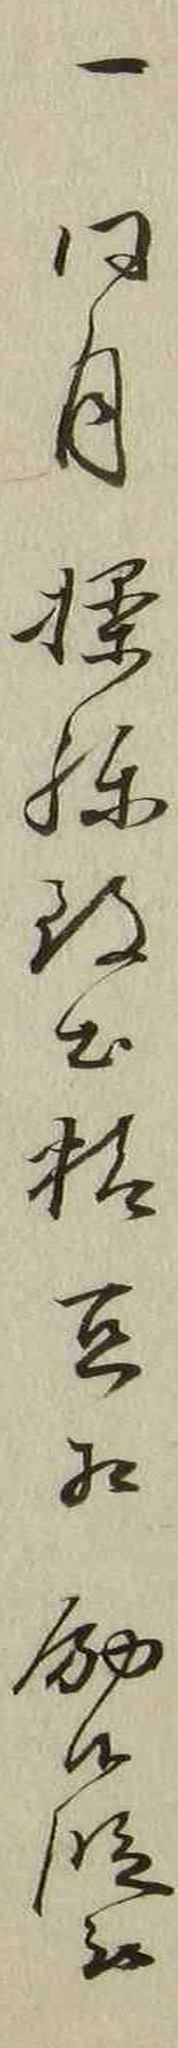一同月操練致出精宜相励候段被
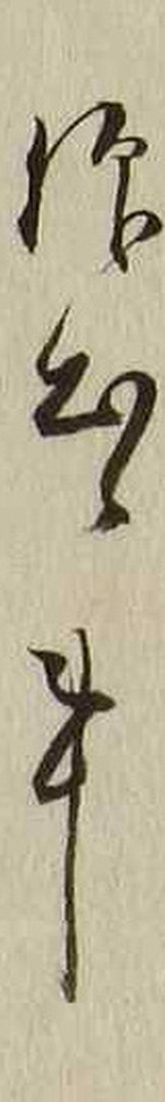仰出候事
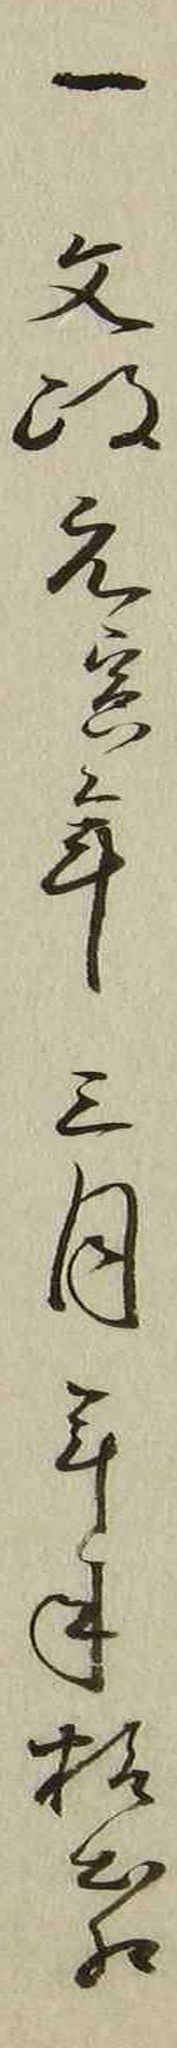一文政元寅年三月年来精出相
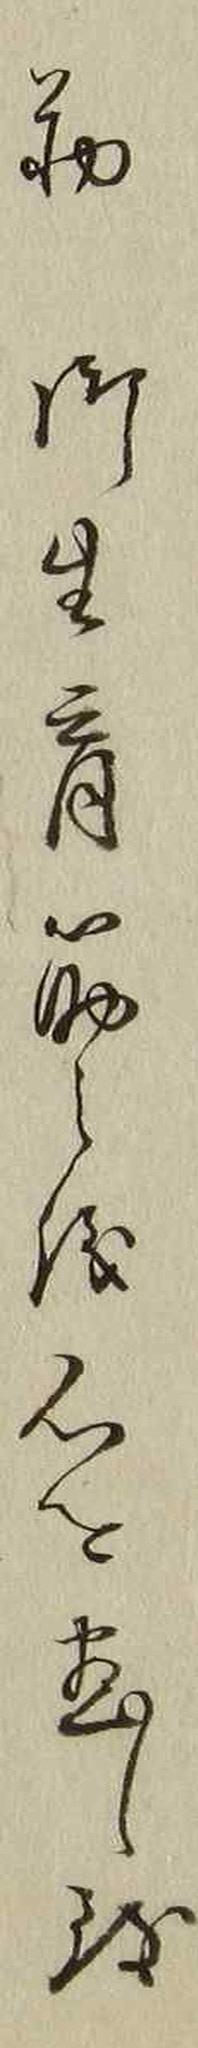勤御生育筋之儀心を尽し致
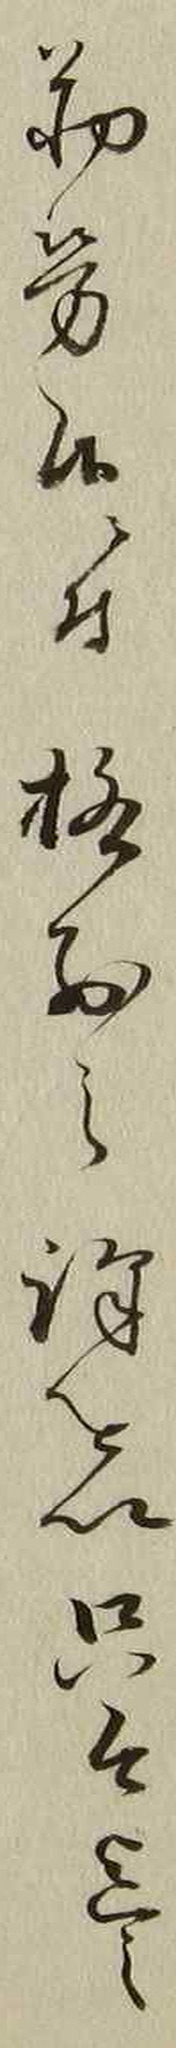勤労候ニ付格別之訳を以只今迄之
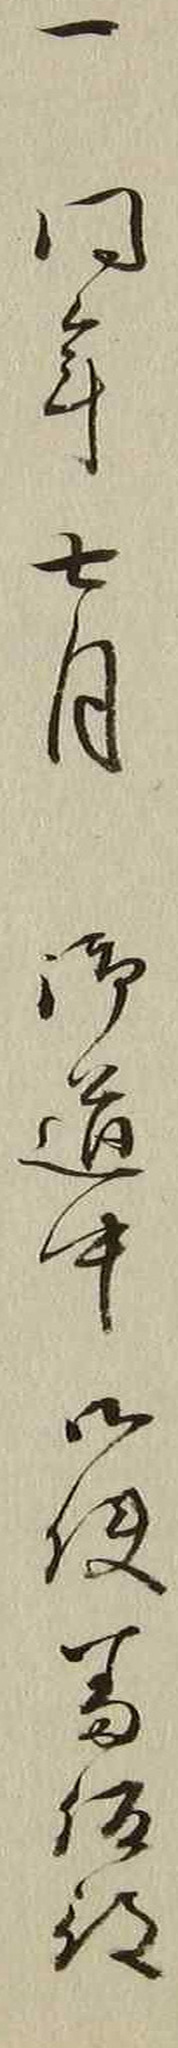一同年七月御道中御使番仮役
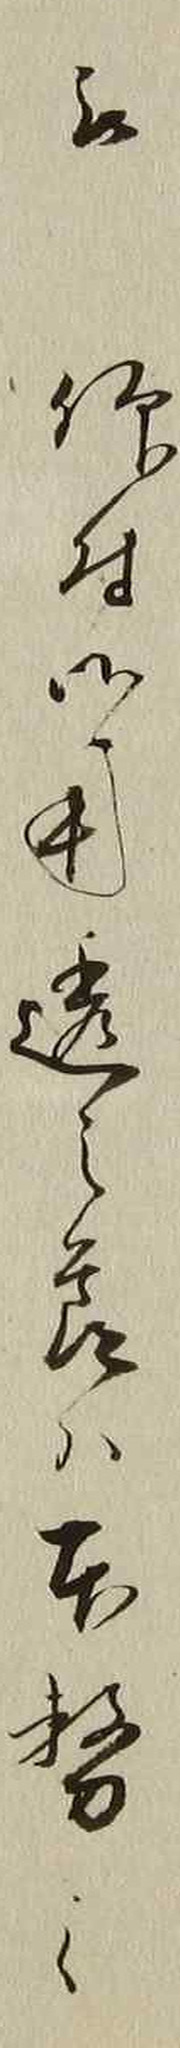被仰付御用透之節ハ本務之
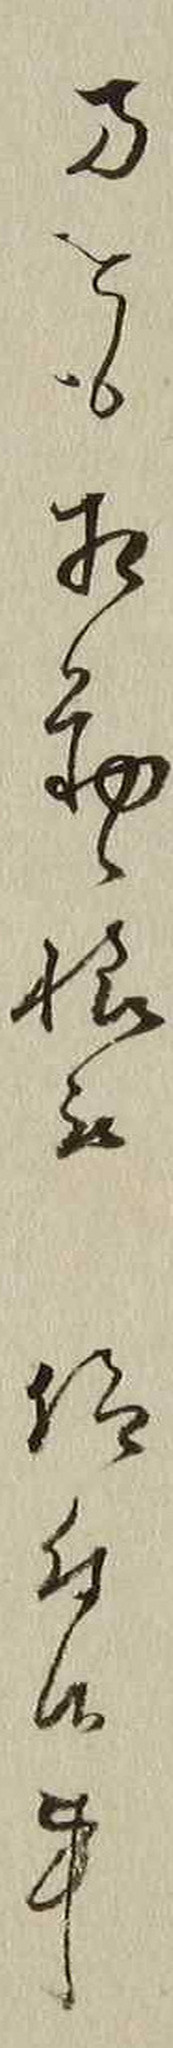方をも相勤候様被仰付候事
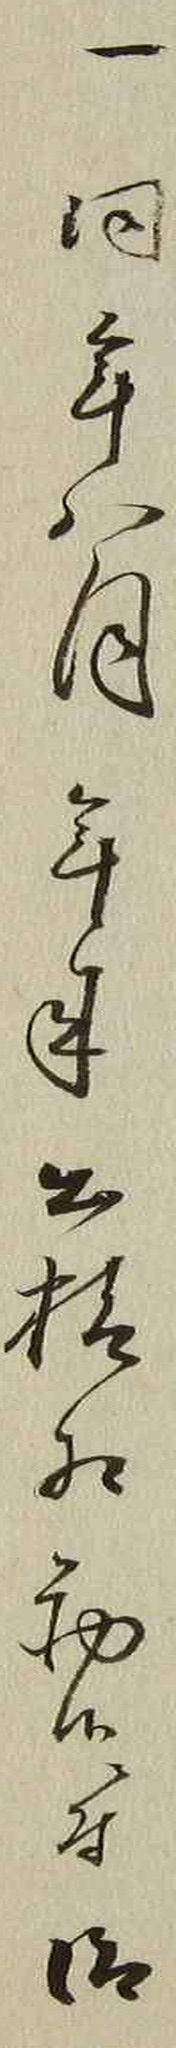一同年八月年来出精相勤候ニ付御
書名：諸士系譜　巻之25　い之部25
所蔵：会津若松市立会津図書館
